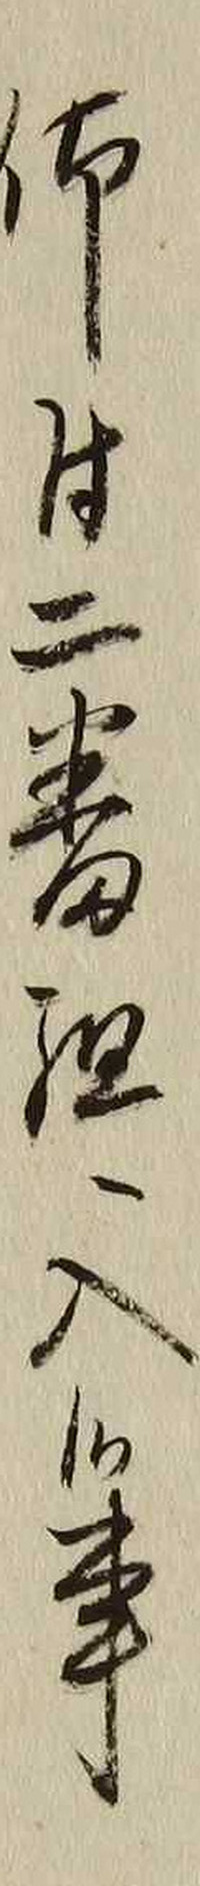仰付二番組へ入候事
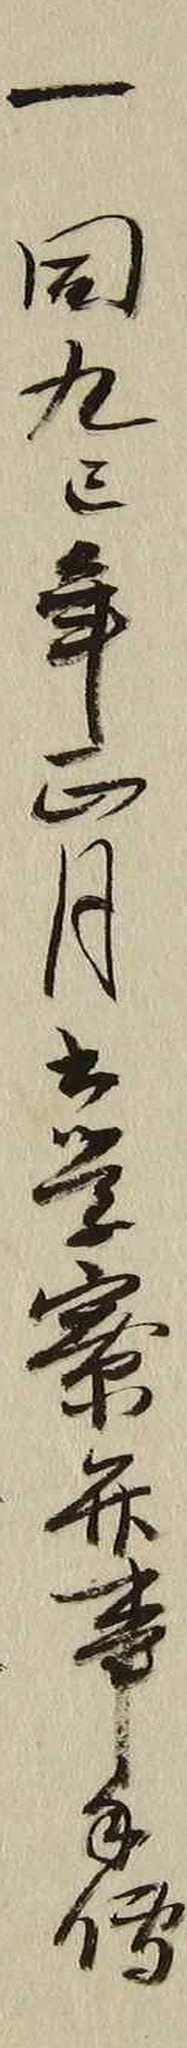一同九巳年正月書学寮弁事手伝
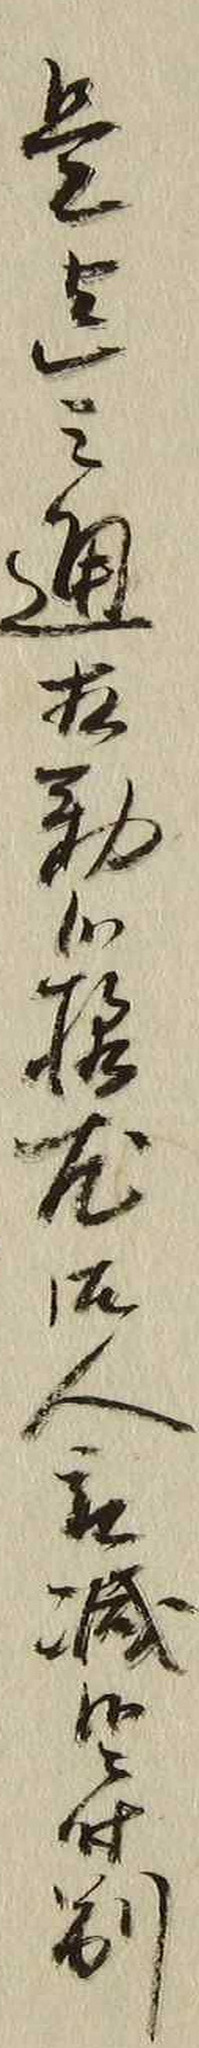是迄之通相勤候様尤御人被減候ニ付別
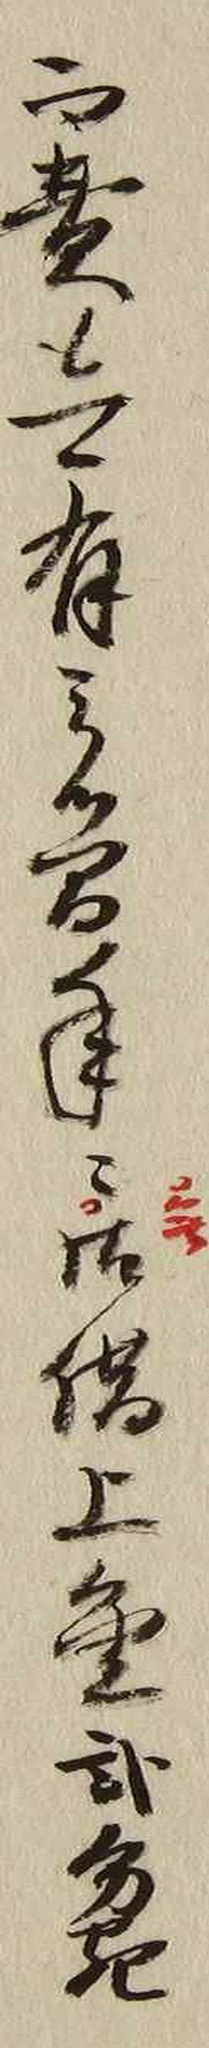而費も可有之候間年ニ無御借上金弐分宛
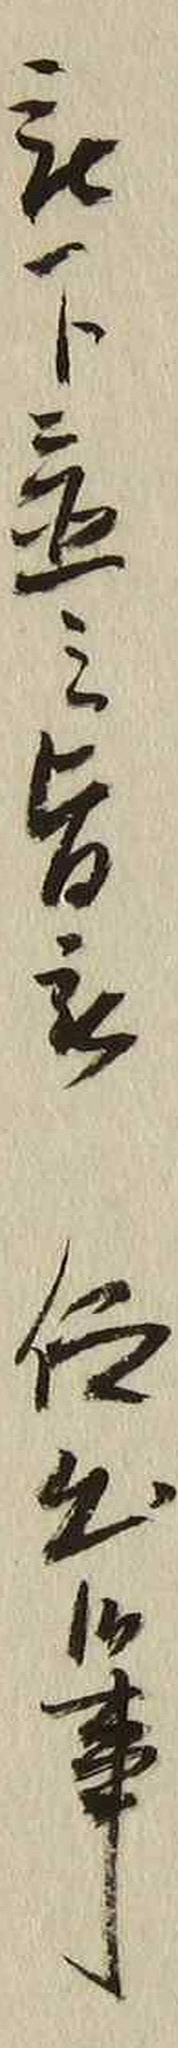被下置之旨被仰出候事
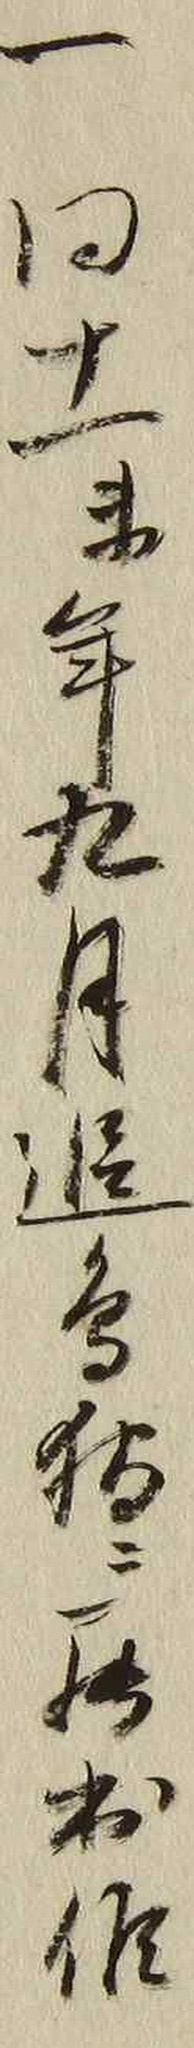一同十一未年九月追鳥狩ニ罷出候
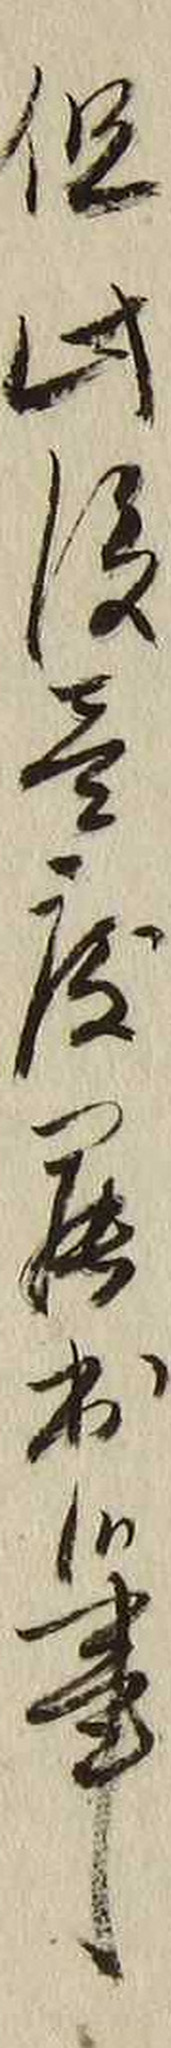但此後壱度罷出候事
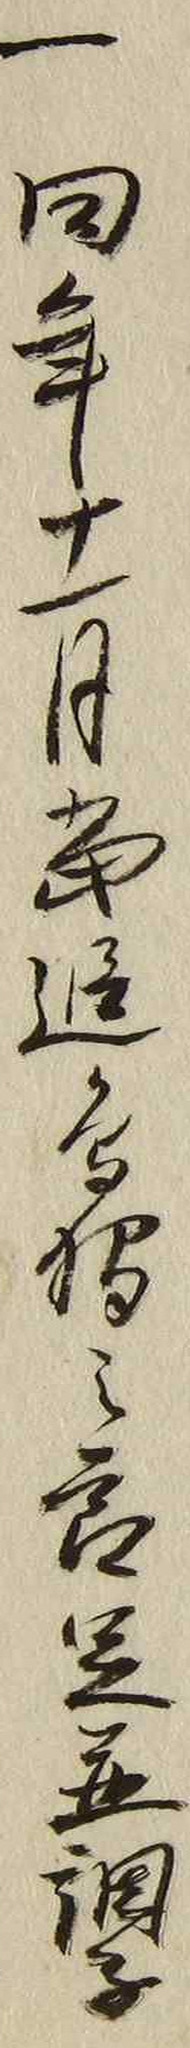一同年十一月当追鳥狩之節足並調子
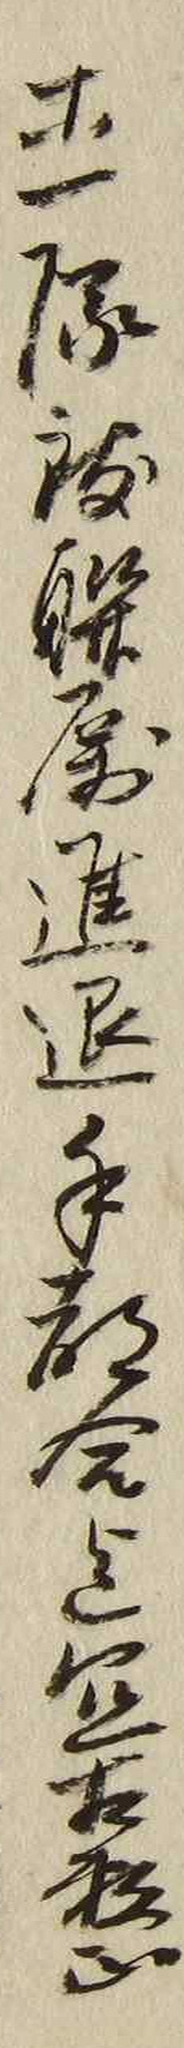等一隊致聯属進退手都合迄宜相整
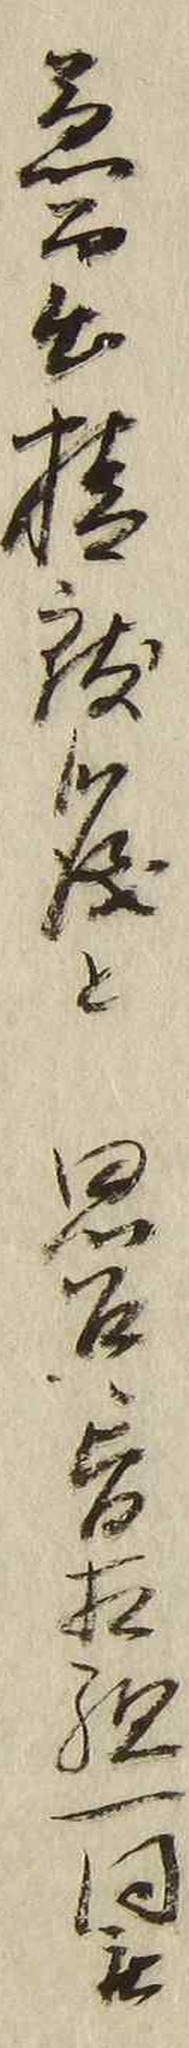兼而出精致候儀と思召候旨相組一同被

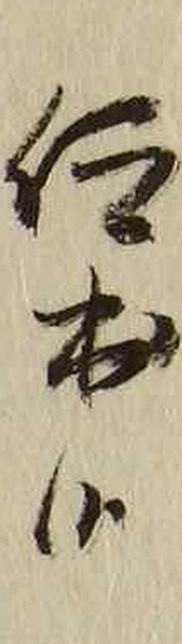仰出候
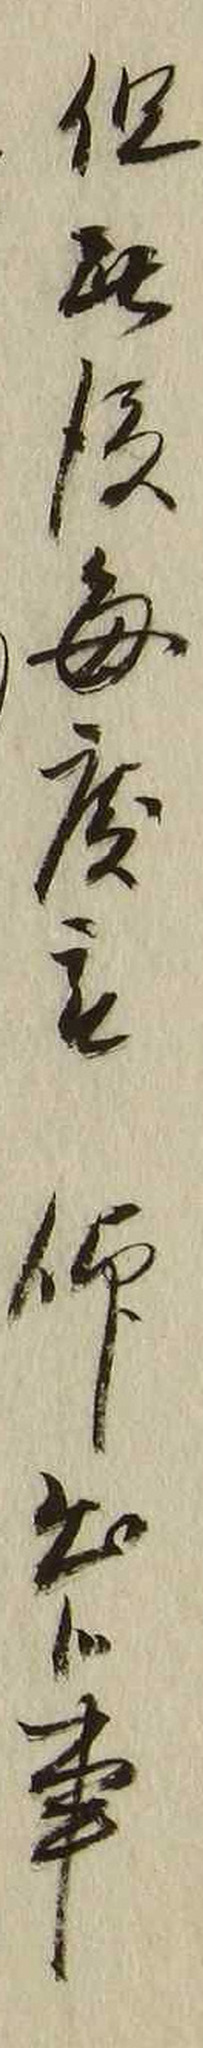但此後毎度被仰出候事
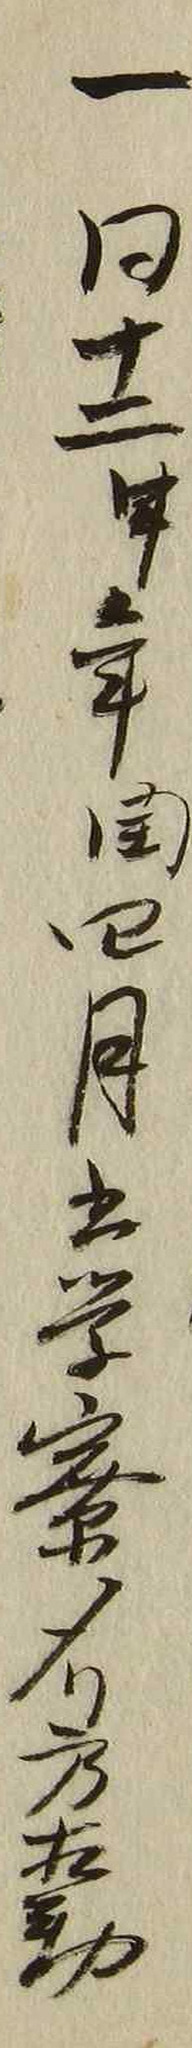一同十二申年閏四月書学寮〆り方相勤
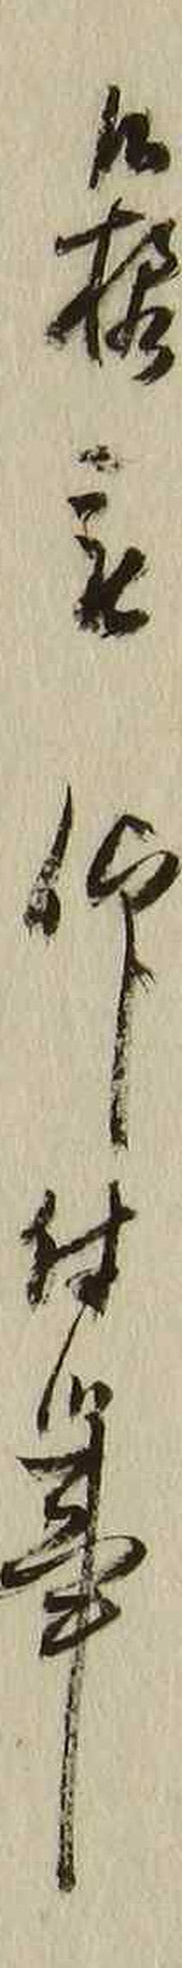候様被仰付候事
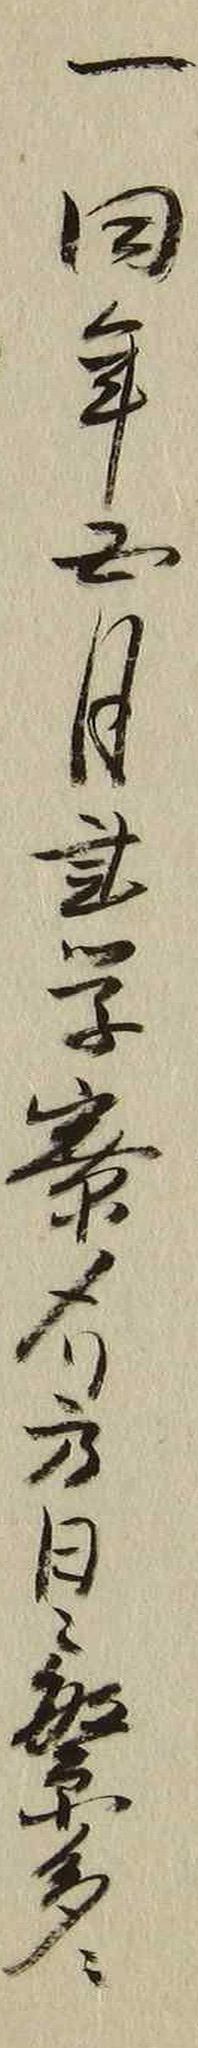一同年五月武学寮〆り方日々繁多ニ
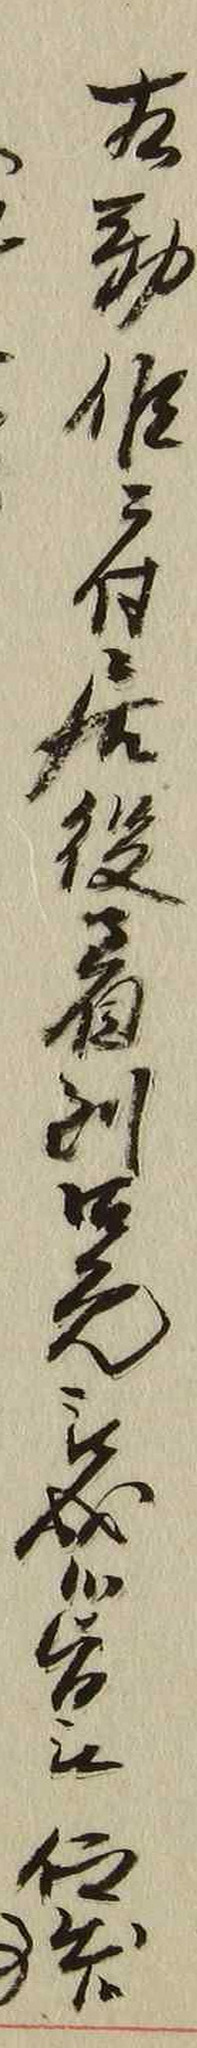相勤候ニ付居役着到御免被成候旨被仰出候事
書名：諸士系譜　巻之349　も之部5
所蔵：会津若松市立会津図書館
